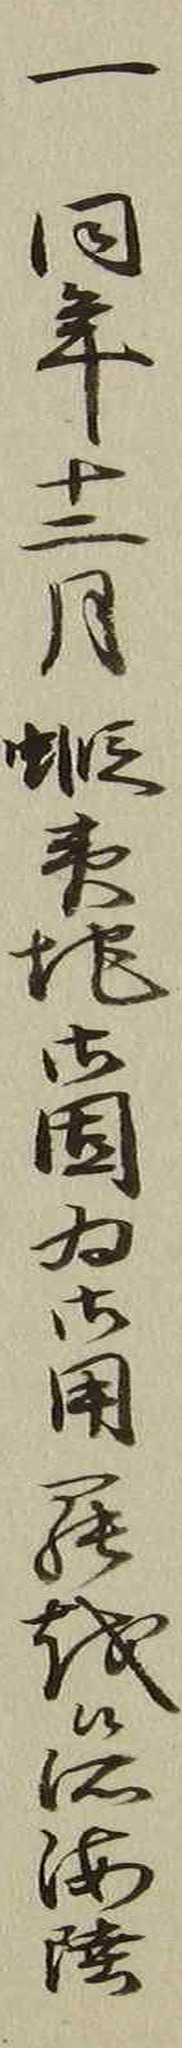一同年十二月蝦夷地御固為御用罷越候所海陸
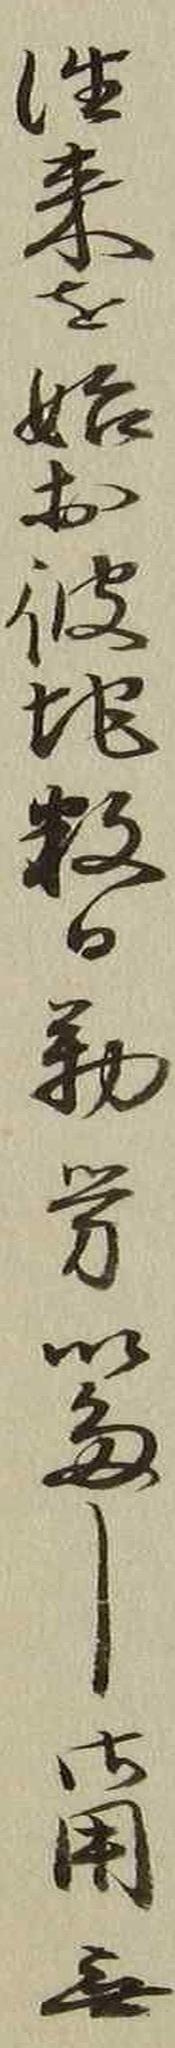往来を始於彼地数日勤労いたし御用無
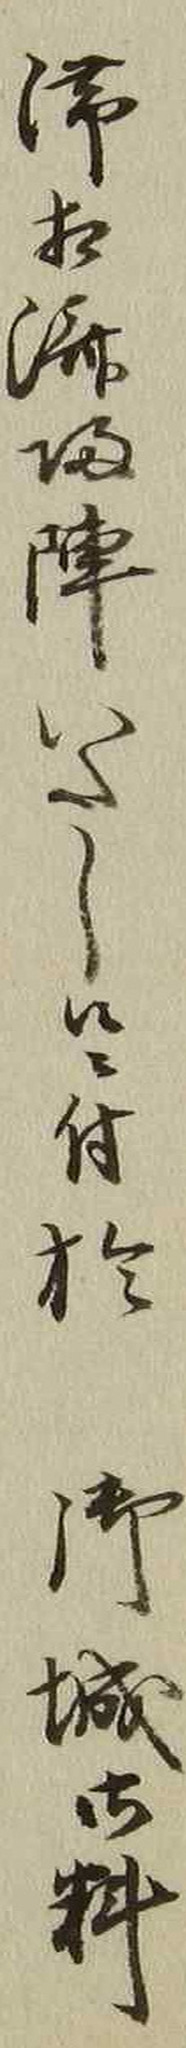滞相済帰陣いたし候に付於御城御料
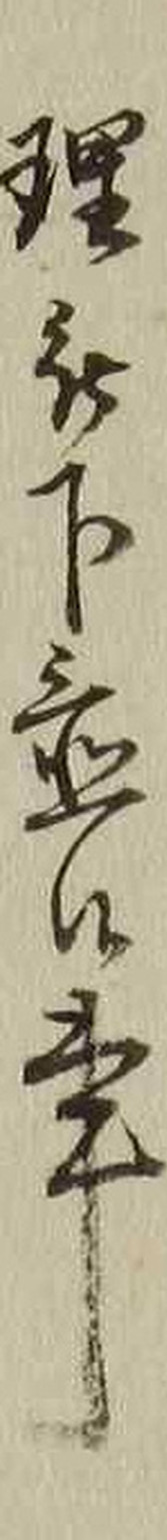理被下置候事
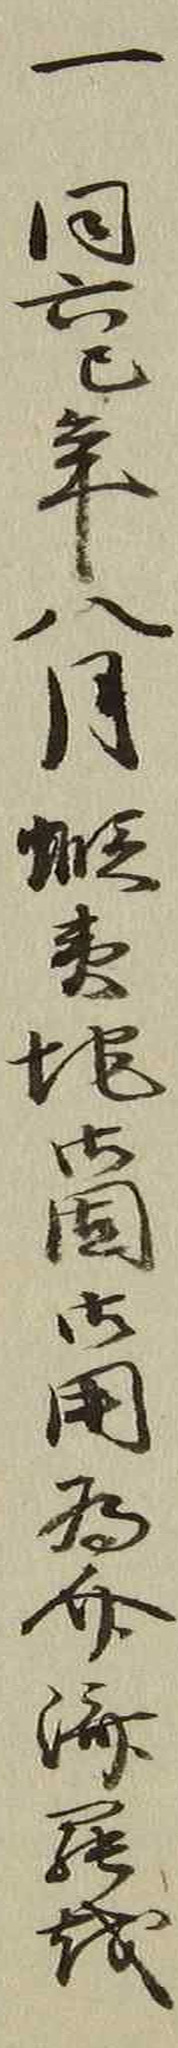一同六年巳八月暇夷地御固御用為介添罷越
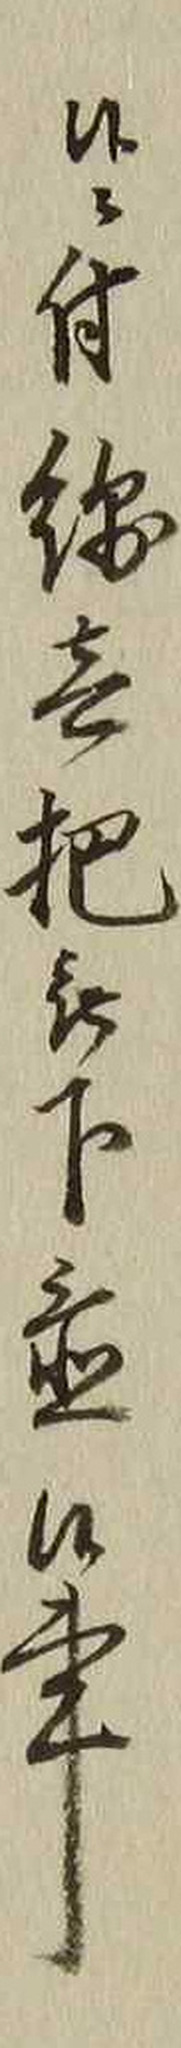候に付綿壱杷被下置候事
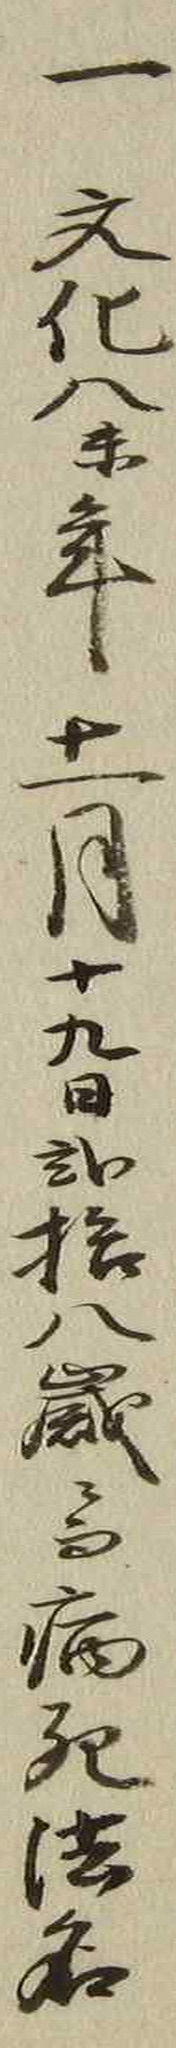一文化八未年十一月十九日弐拾八歳に而病死法名
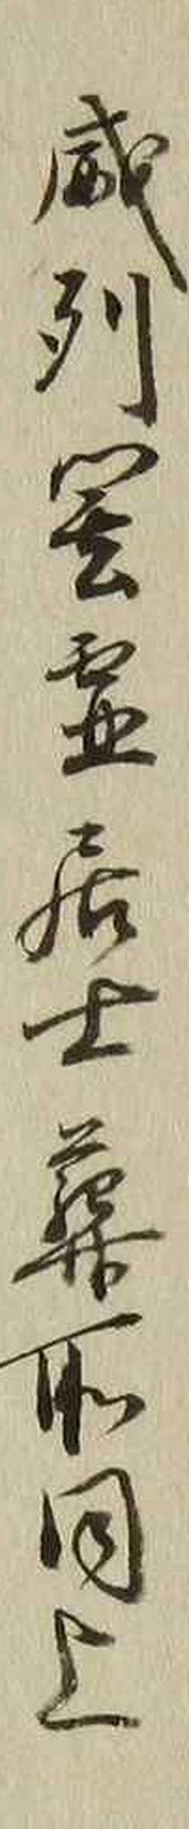威列関霊居士葬所同上
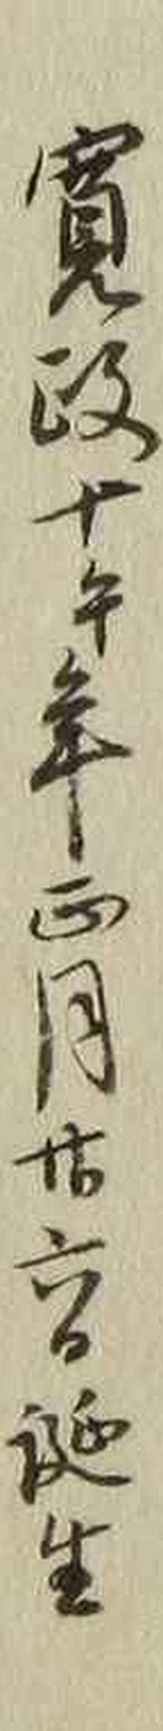女寛政十午年正月廿六日誕生
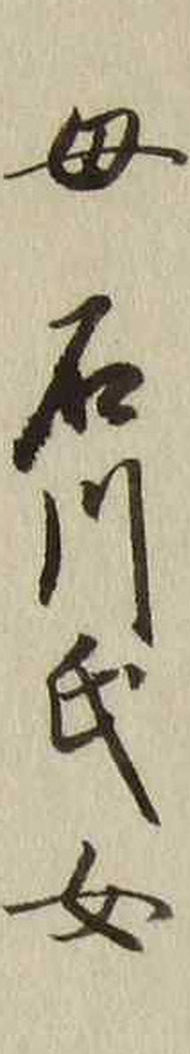母石川氏女
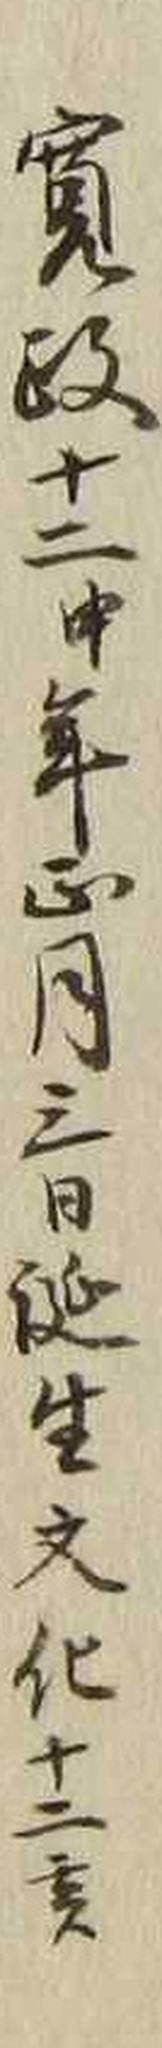寛政十二申年正月三日誕生文化十二亥
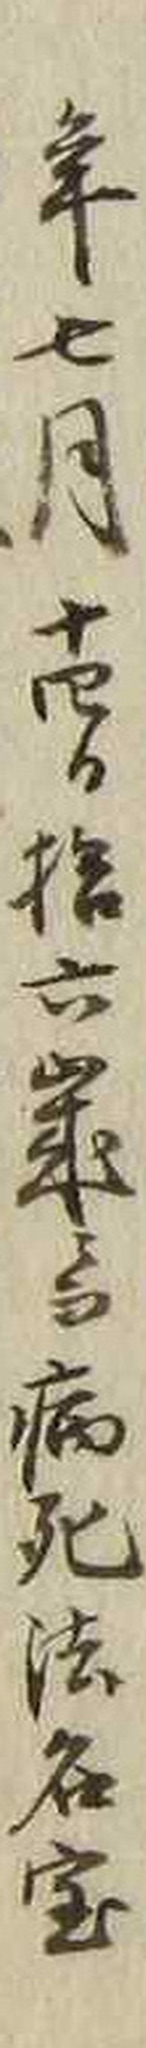女年七月十四日拾六歳に而病死法名宝
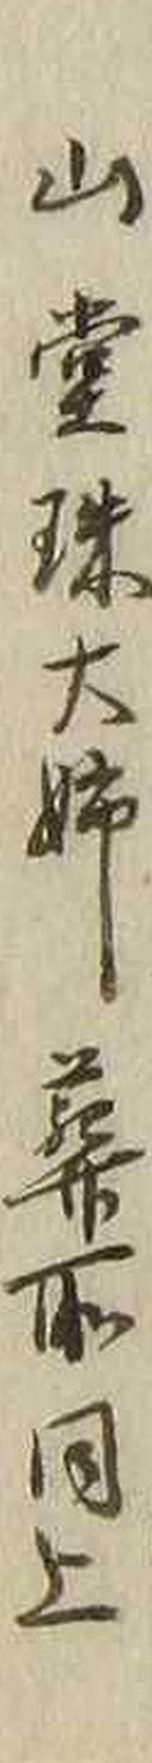山堂珠大姉葬所同上
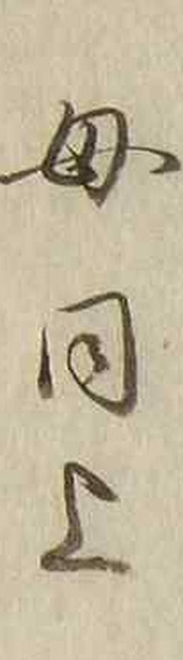母同上
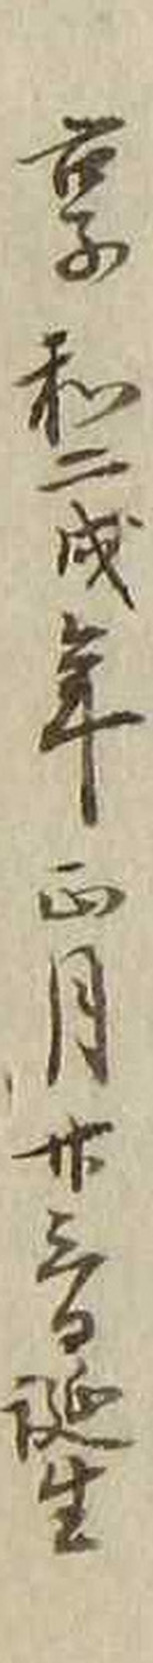女享和二成年正月廿三日誕生

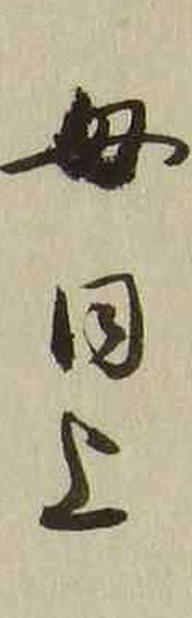母同上
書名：諸士系譜　巻之133　た之部9
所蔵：会津若松市立会津図書館
